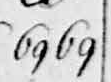6969
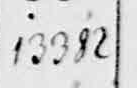13382
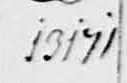13171
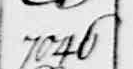7046
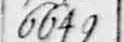6649
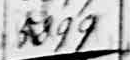5899
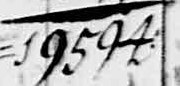19594
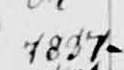7837
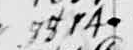7514
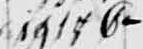19156
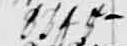8345
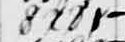8231
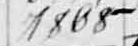7868
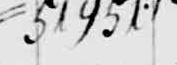51951
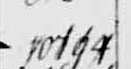10794
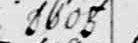3905
